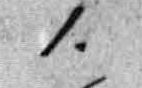1.
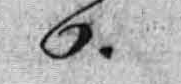6.
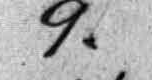9.
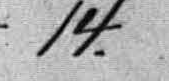14.
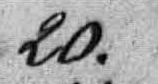20.
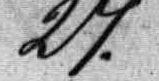27.
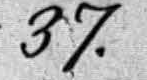37.
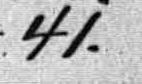41.
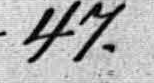47.
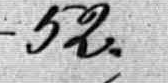52.
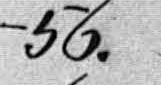56.
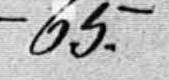65.
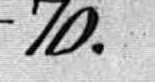70.
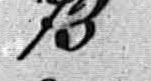73
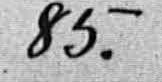85.
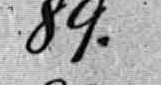89.
